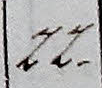22
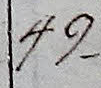49
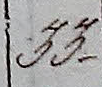33
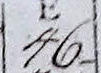46
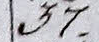37
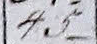45
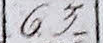63
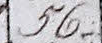56
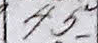45
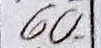60
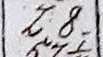28
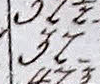32
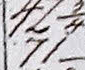71
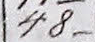48
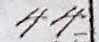44
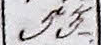53
